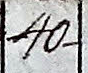40
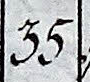35
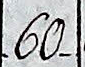60
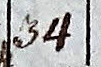34
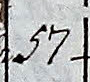57
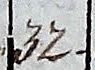32
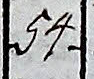54
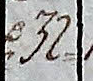32
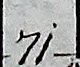71
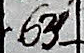63
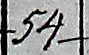54
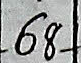68
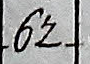62
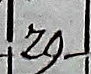29
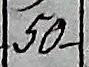50
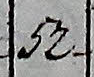52
